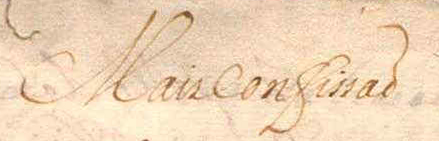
Mais confissaõ
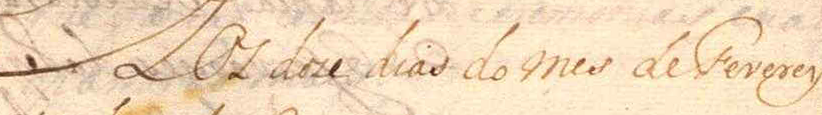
Aos doze dias do mes de Feverey
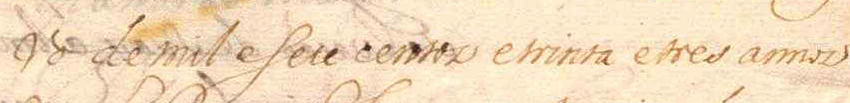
ro de mil e setecentos e trinta e tres annos
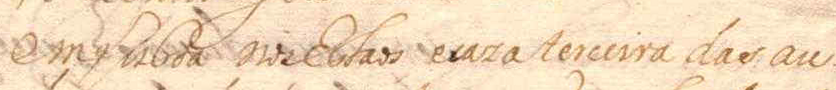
em Lisboa nos Estaos e caza terceira das au
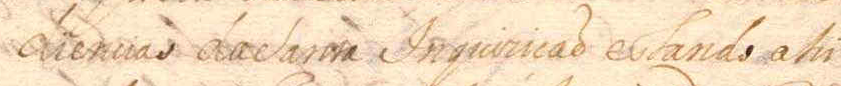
diencias da Santa Inquiziçaõ estando ahi
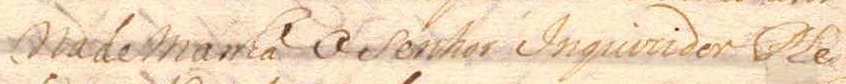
Na de manhã o Senhor Inquizidor Phe
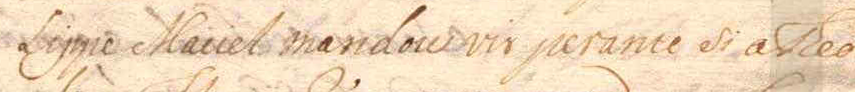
Lippe Maciel mandou vir perante si a Theo
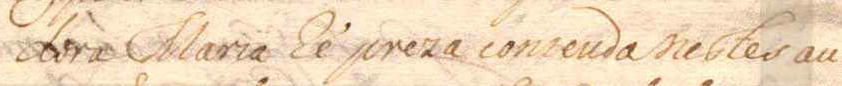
dora Maria Ré preza conteuda nestes au
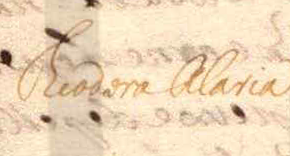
Thedora Maria
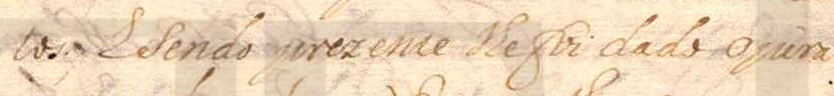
tos; E sendo prezente lhe foi dado o jura
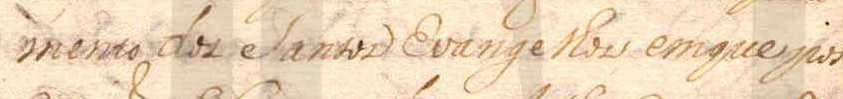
mento dos Santos Evangelhos em que pos
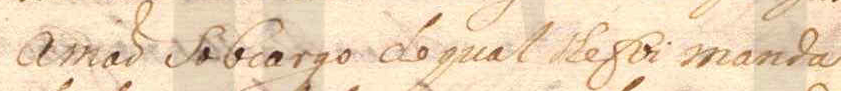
A maõ sob cargo do qual lhe foi manda
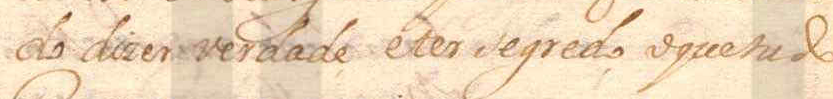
do dizer verdade, e ter segredo o que tudo
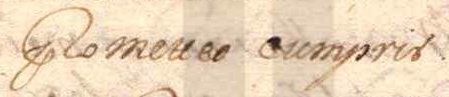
pRometteo cumprir.
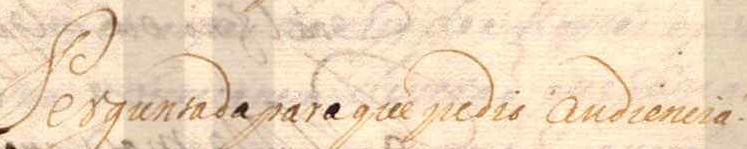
Perguntada para que pedio audiencia?
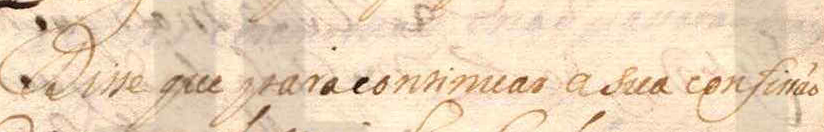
Disse que para continuar a sua confissaõ
